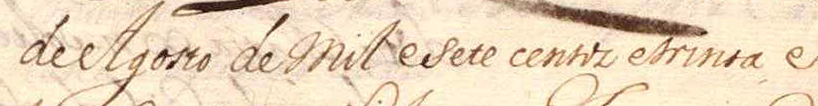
de Agosto de mil e setecentoz e trinta, e
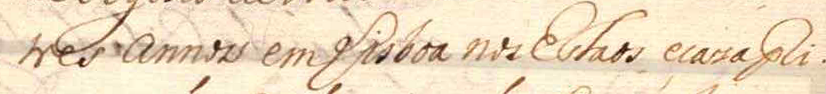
tres annos em Lisboa nos Estaos, e caza pRi
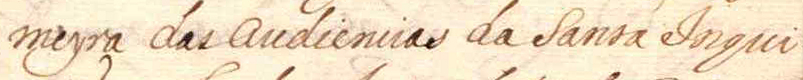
meyra das audiencias da Santa Inqui
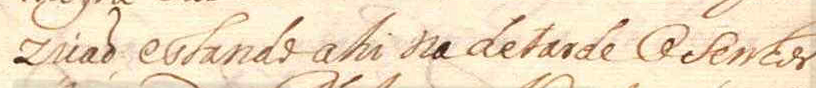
ziçaõ, estando ahi na de tarde O Senhor
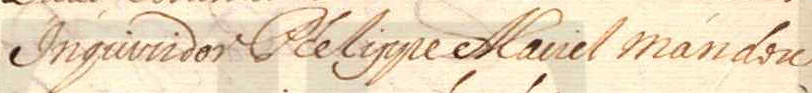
Inquizidor Phelippe Maciel mandou
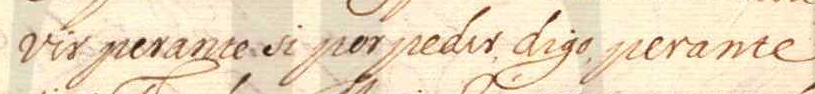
vir perante si por pedir, digo, perante
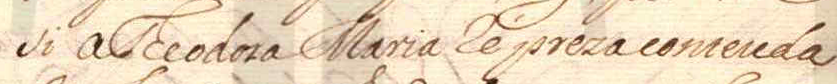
si, a Theodora Maria Ré preza conteuda
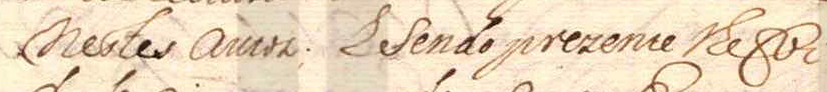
nestes autoz; E sendo prezente lhe foi
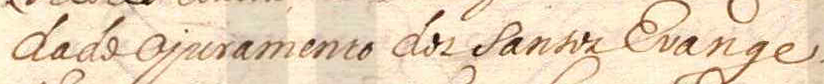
dado o juramento dos Santoz Evange
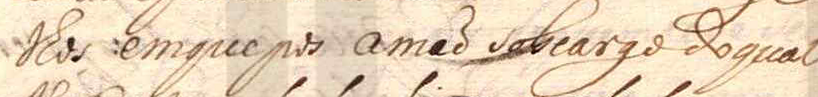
lhos em que pos a maõ sob cargo do qual
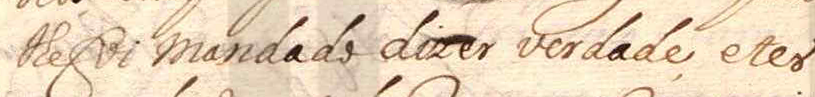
lhe foi mandado dizer verdade, e ter
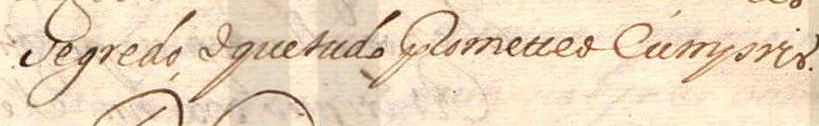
Segredo o que tudo prometteo cumprir.
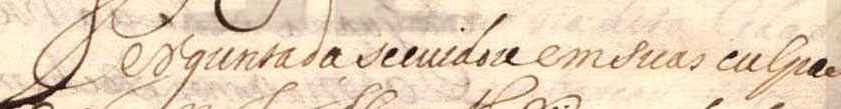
Perguntada se cuidou em suas culpas
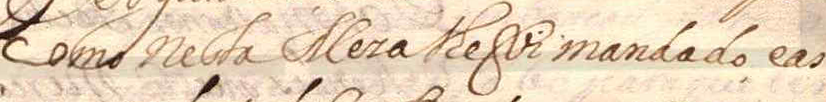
Como nesta Meza lhe foi mandado e as
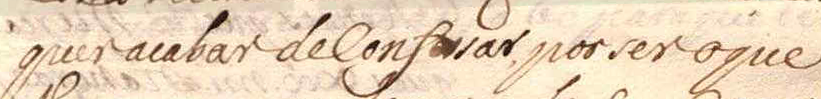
quer acabar de confessar por ser o que
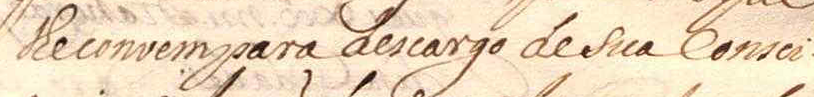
lhe convem para descargo de sua Consci
